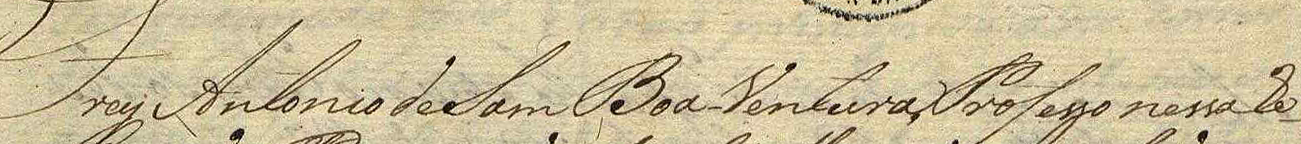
Frey Antonio de Sam Boa-Ventura, Professo nesta Re
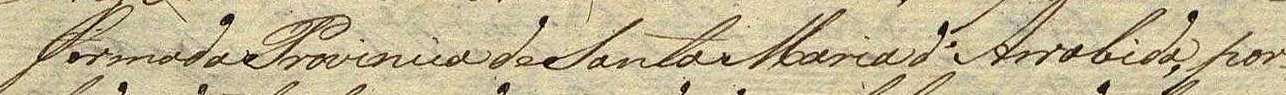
formada Provincia de Santa Maria d'Arrabida, por
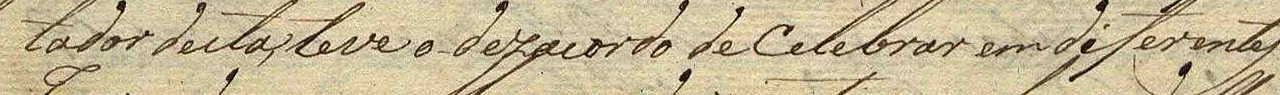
tador desta, teve o dezacordo de celebrar em diferentes
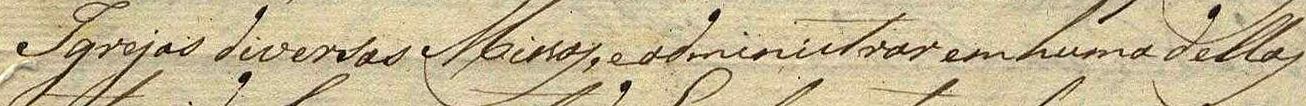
Igrejas diversas Missas, e administrar em huma dellas
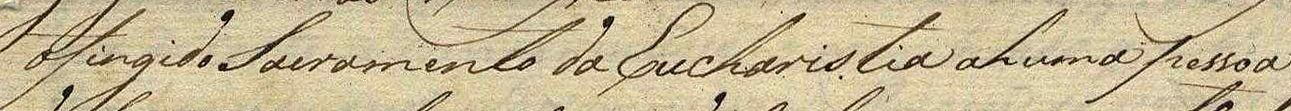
o fingido Sacramento da Eucharistia a huma pessoa
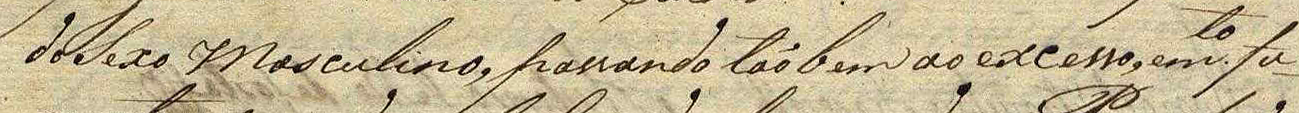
do Sexo Masculino, passando taõbem ao excesso, e mto. fu
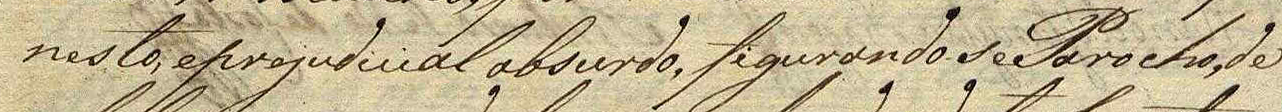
nesto, e prejudicial absurdo, figurando-se Parocho, de
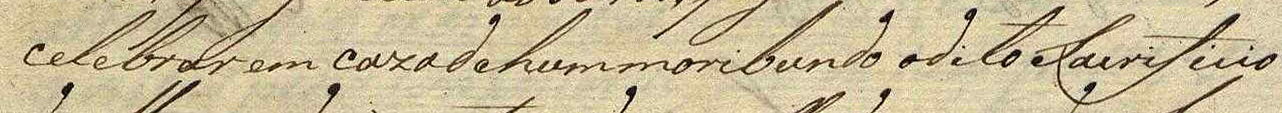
celebrar em caza de hum moribundo o dito Sacrificio
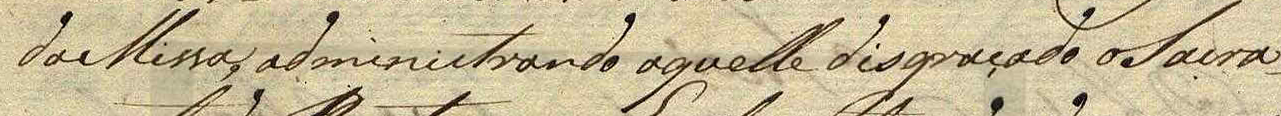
da Missa, administrando aquelle disgraçado o Sacra
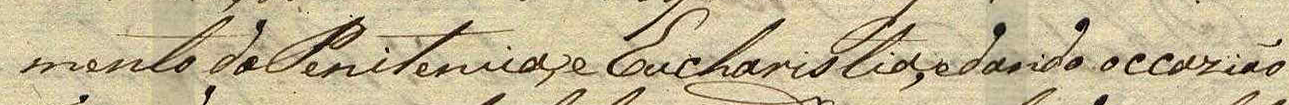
mento da Penitencia, e Eucharistia, e dando occaziaõ
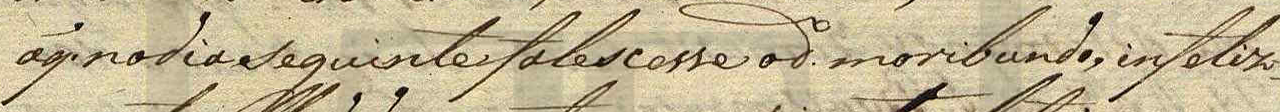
a q̄ no dia seguinte falescesse o d.o moribundo, infeliz
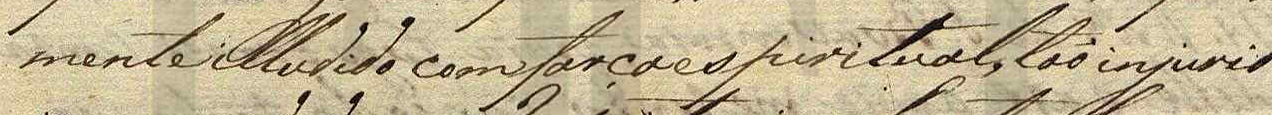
mente illudido com farça espiritual, taõ injurio
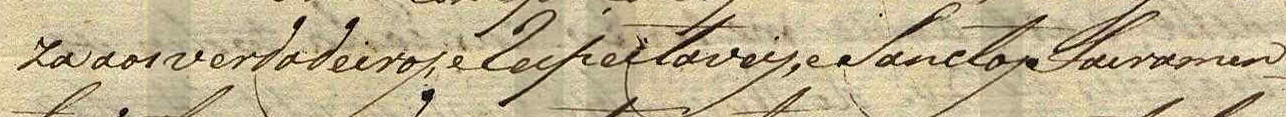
za aos verdadeiros, e Respeitaveis, e Sanctos Sacramen
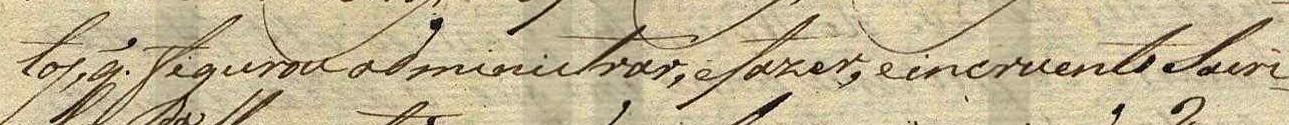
tos, q̄ figurou administrar, e fazer, e incruento Sacri
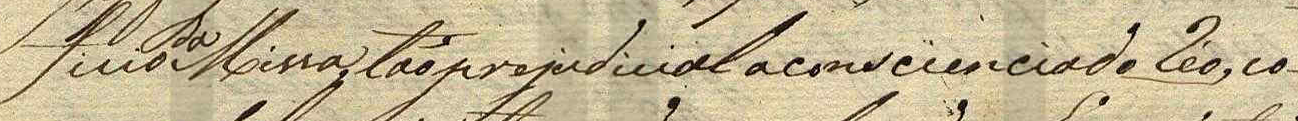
ficio da Missa, taõ prejudicial a consciencia do Réo, co
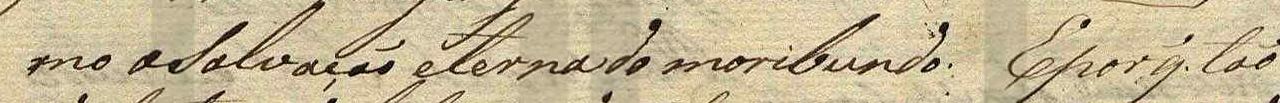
mo a Salvaçaõ eterna do moribundo. E porq̄ taõ
